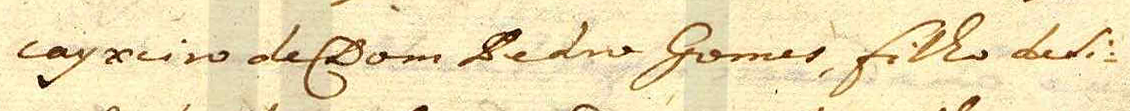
cayxeiro de Dom Pedro Gomes, filho de Si
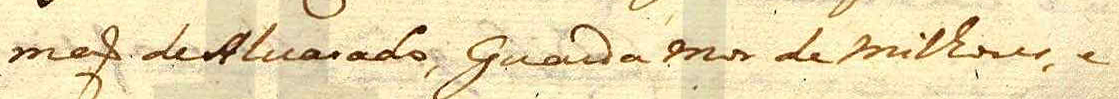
maõ de Aluarado, Guarda mor de milhores, e
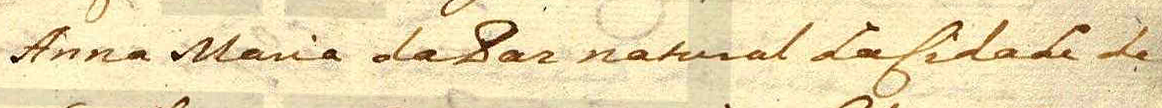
Anna Maria da Paz natural da Cidade de
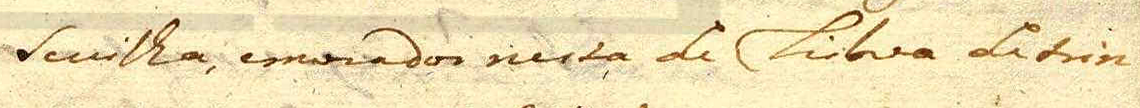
Seuilha, e morador nesta de Lisboa de trin
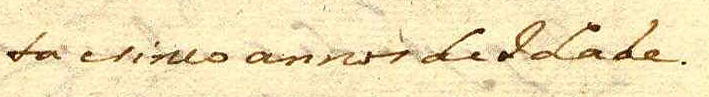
ta e sinco annos de Idade.
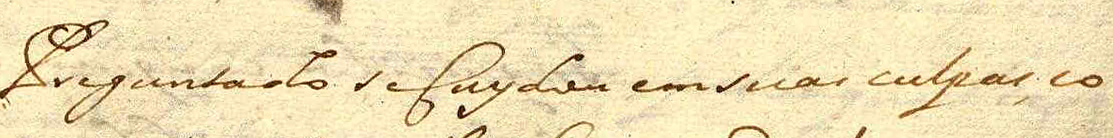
Preguntado se Cuydou em suas culpas, co
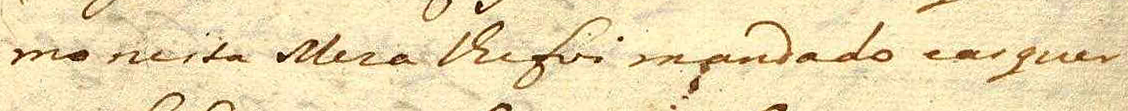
mo nesta Meza lhe foi mandado e as quer
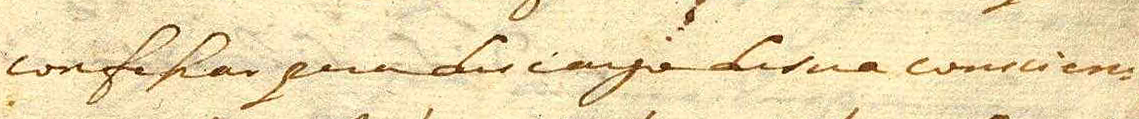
confessar pera descargo de sua conscien
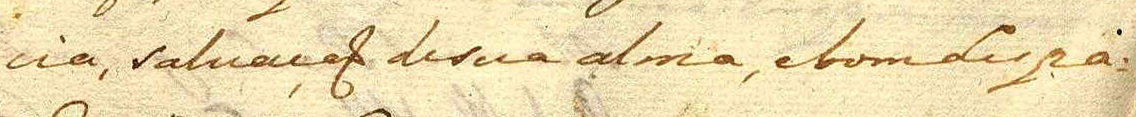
cia, saluaçaõ de sua alma, e bom despa
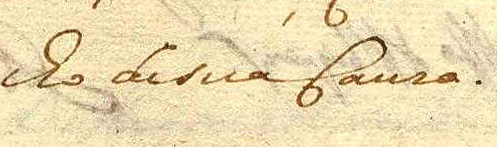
cho de sua Cauza.
